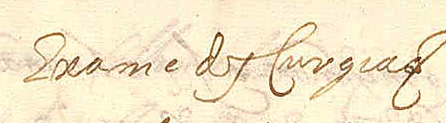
Exame dos Curgiaõ
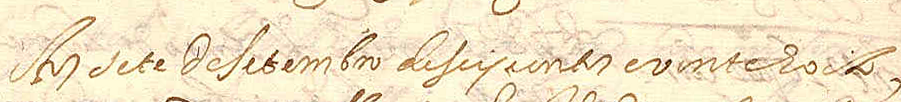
Aos sete de Setembro de seiscentos e vinte E oito
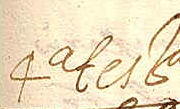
4a testa
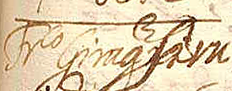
Frco Giraõ Siru
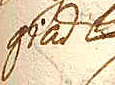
giaõ
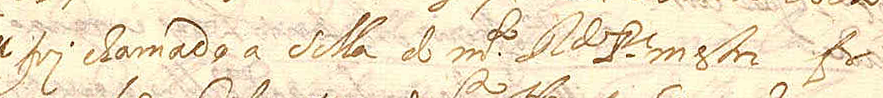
foj chamado a Sella do m.to Rdo P.e mestre fr
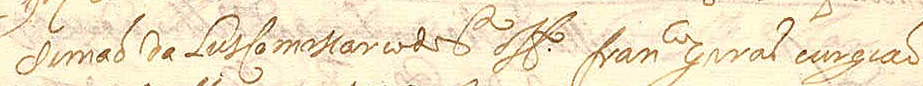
Simaõ da Lus Comissario do sto off.o franco giraõ curgiaõ
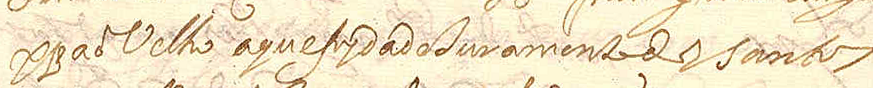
xpaõ Velho a que foy dado Iuramento dos santos
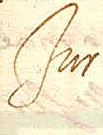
Jur
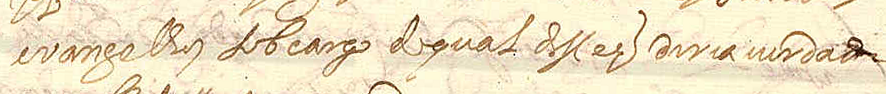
evangelhos sob cargo do qual disse q̄ diria uerdade
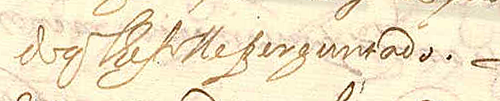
do q̄ lhe fosse perguntado.
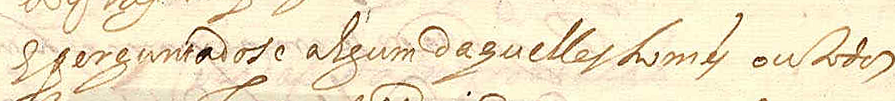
E perguntado se algum daquelles homēs ou todos
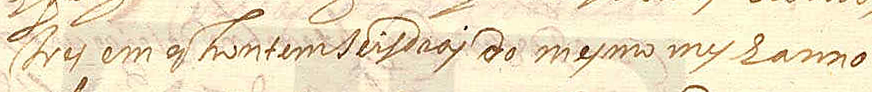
tres em q̄ hontem seis dias do mesmo mes E anno
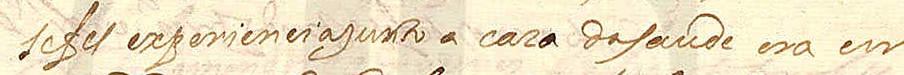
se fes experiencia junto a caza da saude era cir
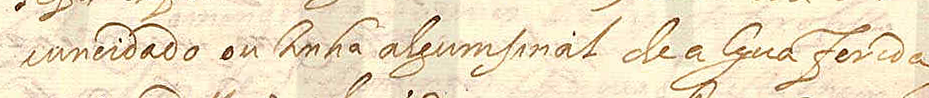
cuncidado ou tinha algum sinal de alguā ferida
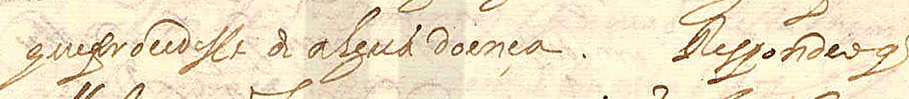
que procedesse de alguā doença. Respondeo q̄
